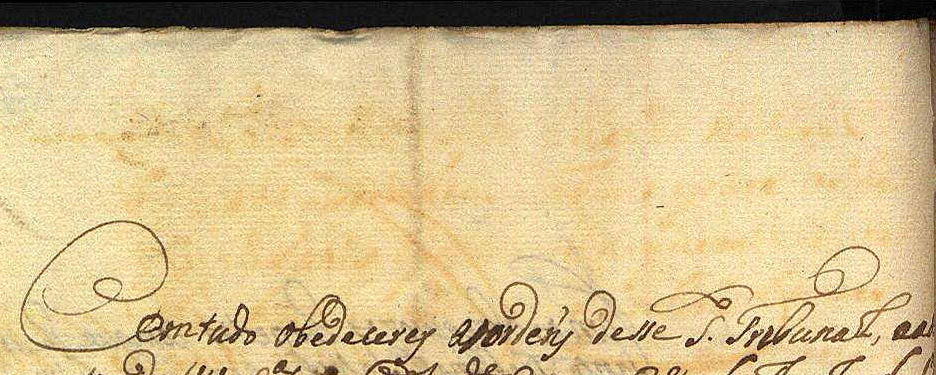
E em tudo obedecerey as orden̄s desse s.to Tribunal, e a
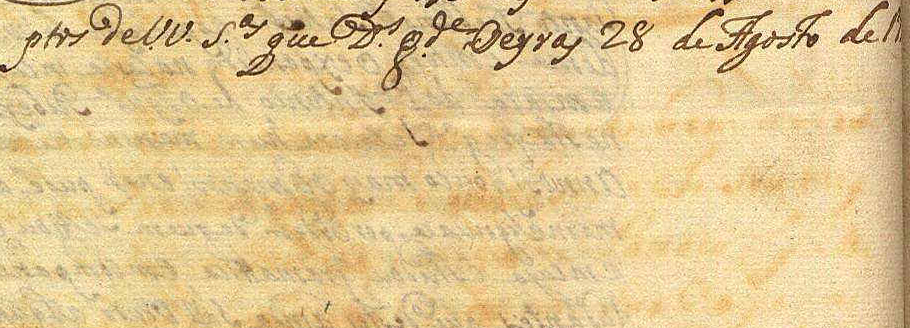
ptos de VV. S.as que D.s g.de Beyras 28 de Agosto de 1
